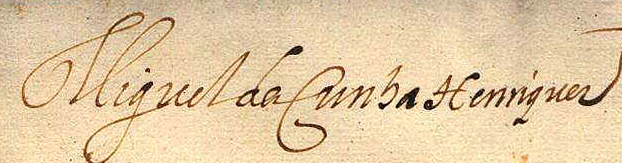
Miguel da Cunha Henriquez
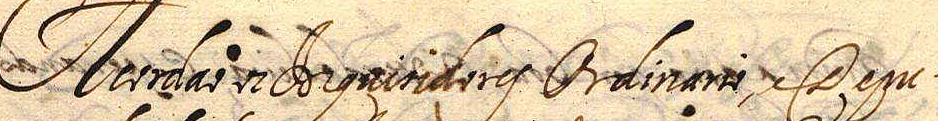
Acordaõ os Inquisidores Ordinario, e Depu
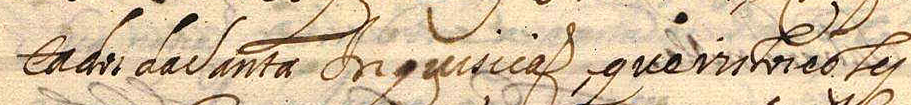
tados da Santa Inquisiçaõ, que vistos estes
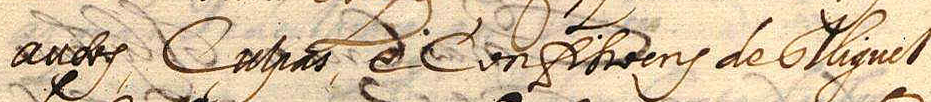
autos, Culpas e Confissoens de Miguel
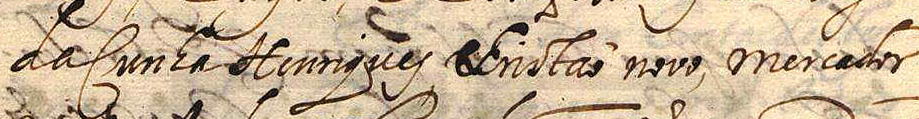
da Cunha Henriques christaõ novo, mercador
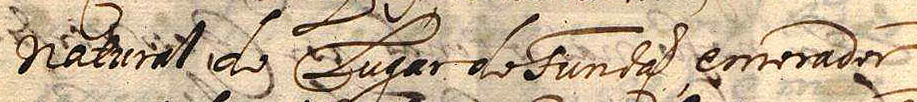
natural do Lugar do Fundaõ, e morador
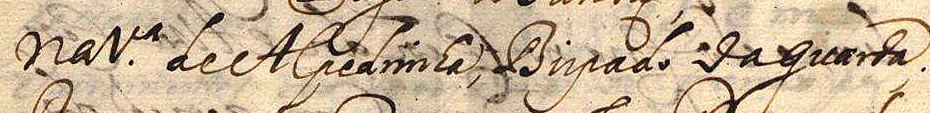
na V.a de Alpedrinha, Bispado da Guarda.
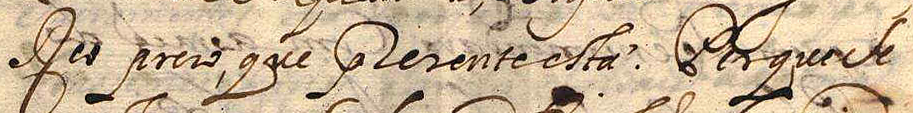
Reo preso, que pRzente está. Porque se
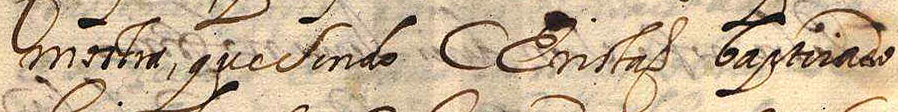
mostra, que sendo Christaõ baptizado
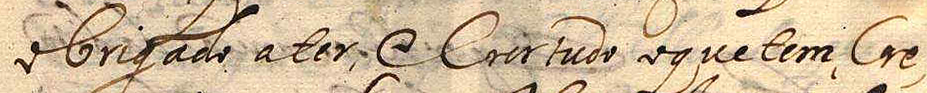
obrigado a ter, e Crer tudo o que tem, Cre
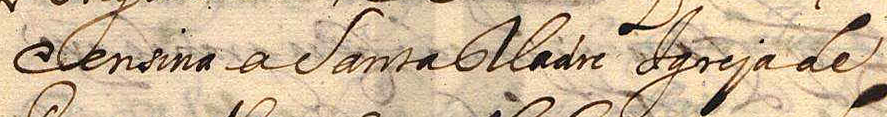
e ensina a Santa Madre Igreja de
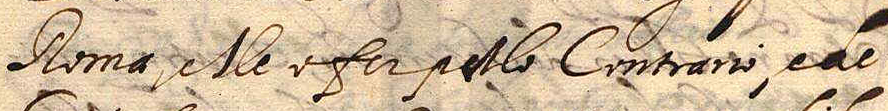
Roma, elle o fez pello Contrario, e de
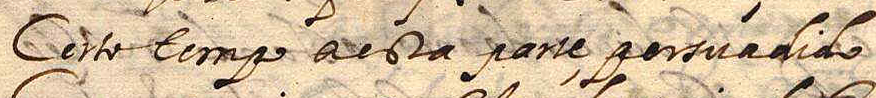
Certo tempo a esta parte, persuadido
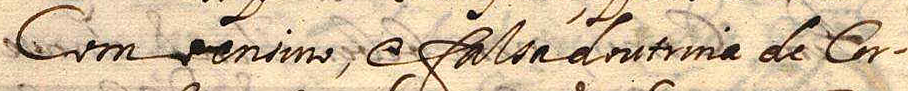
Com o ensino, e falsa doutrina de Cer
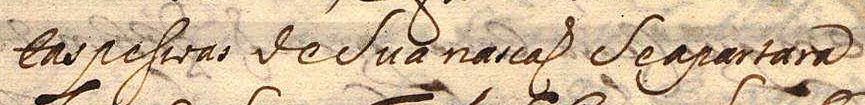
tas pessoas de Sua nasçaõ se apartara
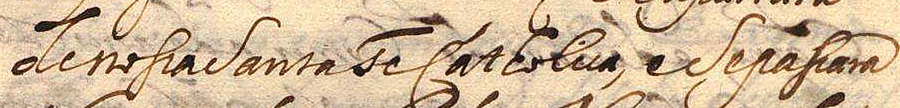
de nossa Santa Fe Catholica, e se passara
